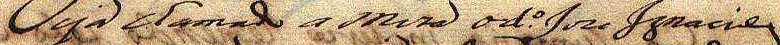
Seja chamado a meza o d.o Joze Ignacio
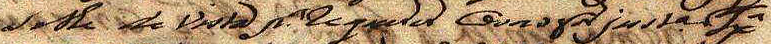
selhe de vista p.a Requerer Como for just.a Lxa
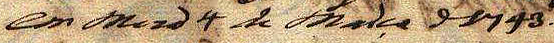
em meza 4 de março d 1743
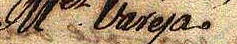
M.el Varejaõ
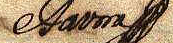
Tavora
